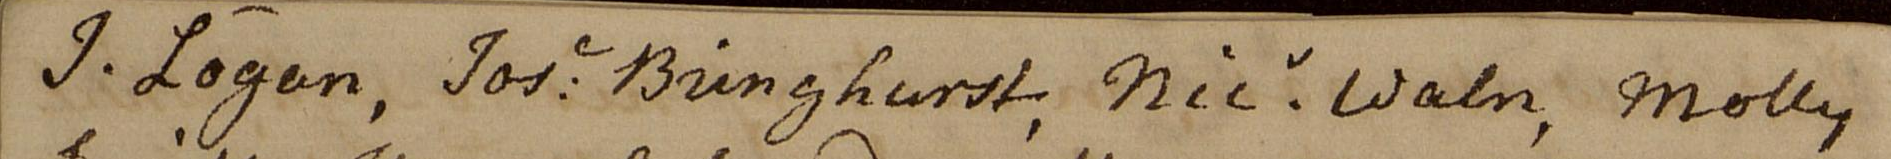I. Logan, Jos^e: Bringhurst, Nic^s. Waln, Molly
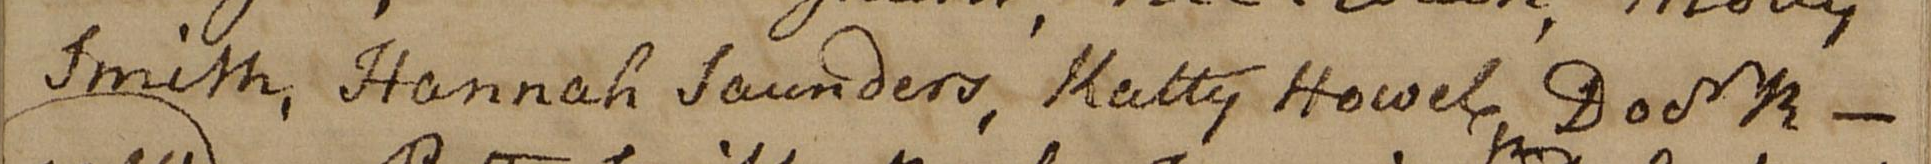Smith, Hannah Saunders, Katty Howel, Doc^r R-
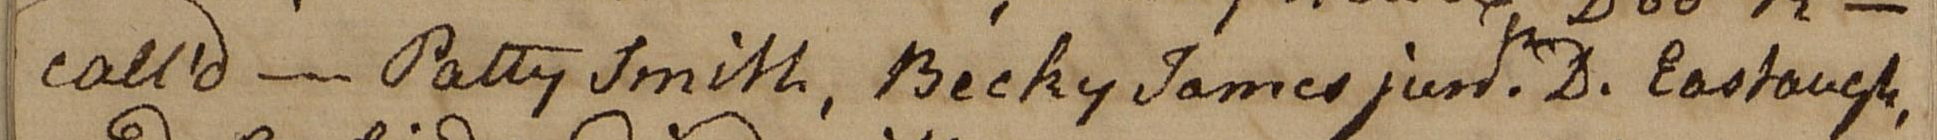call'd- Patty Smith, Becky James jun^r. D Eastaugh,
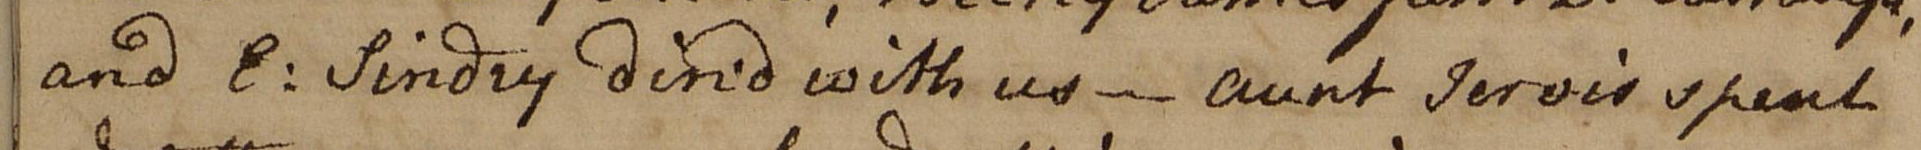and E: Sindry din'd with us- Aunt Jervis spent
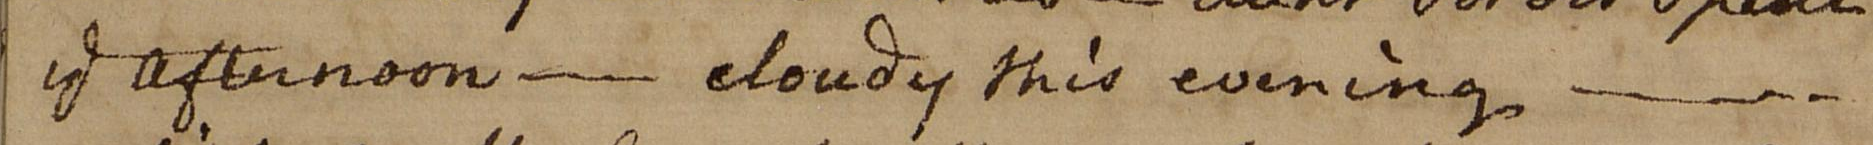y^e afternoon- cloudy this evening--
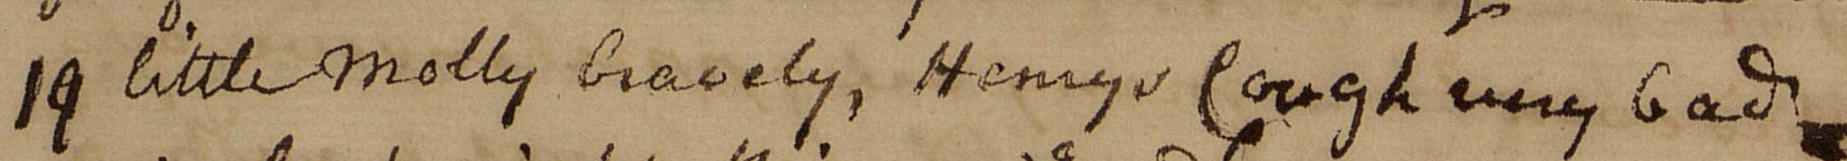19 little Molly bravely, Henrys Cough very bad
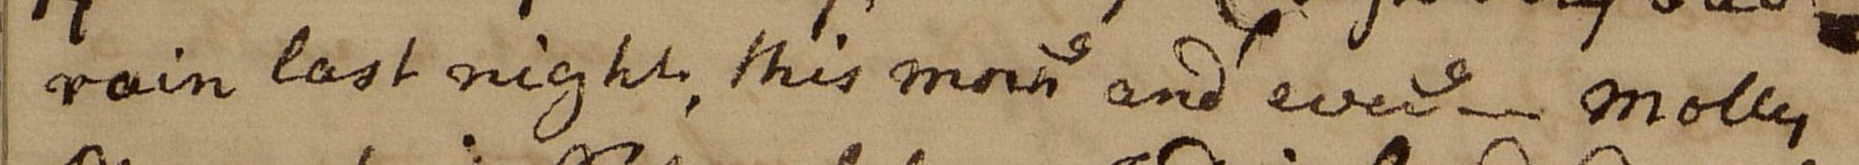rain last night, this morn^g and even^g- Molly
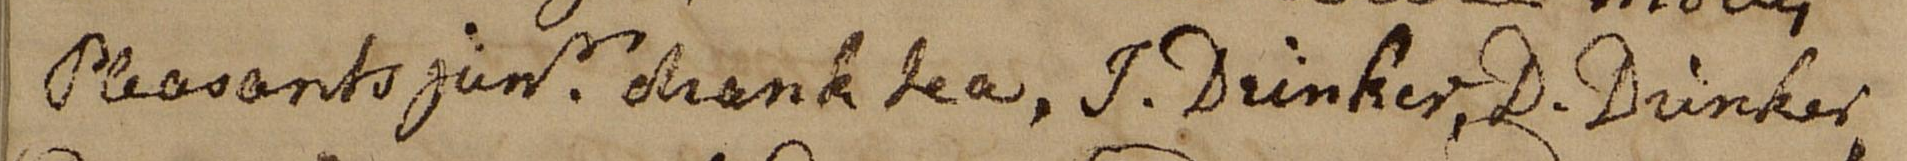Pleasants jun^r. drank tea, I. Drinker, D. Drinker,
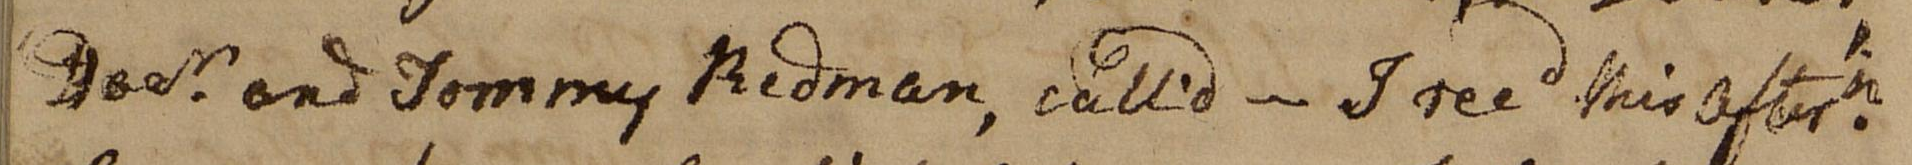Doc^r. and Tommy Redman, call'd- I rec^d this after^n.
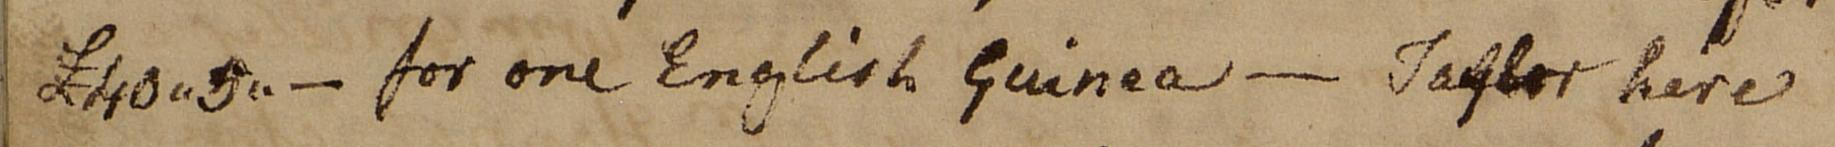£40..5..- for one English Guinea- Taylor here
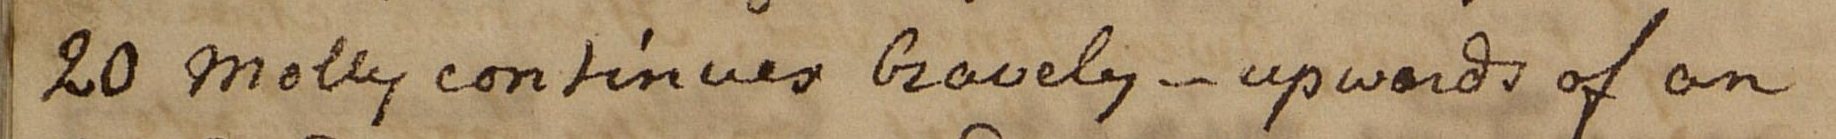20 Molly continues bravely- upwards of an
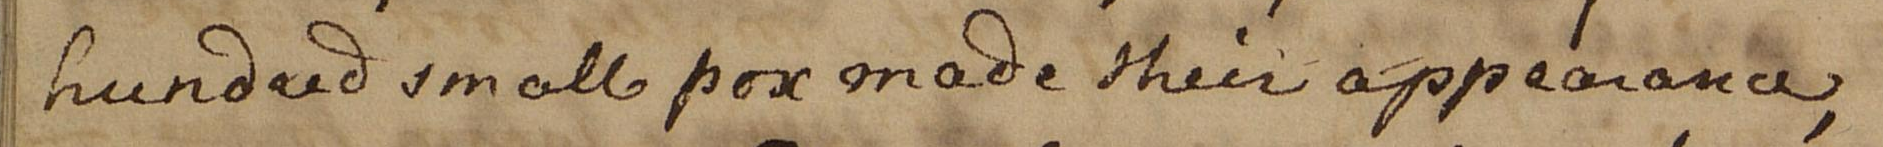hundred small pox made their appearance,
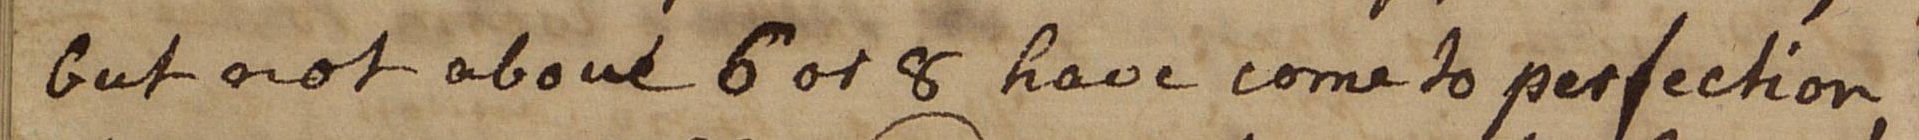but not about 6 or 8 have come to perfection,
